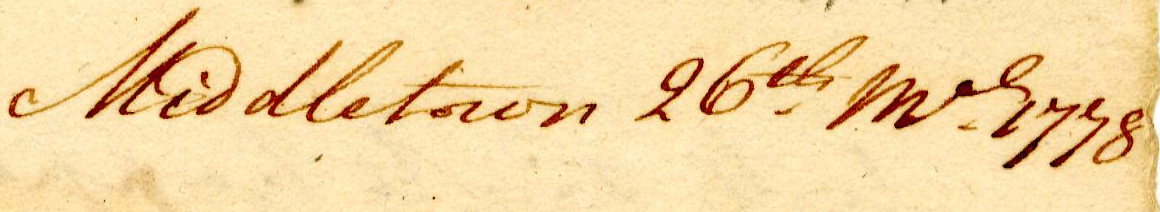Middletown 26^th. M^r. 1778
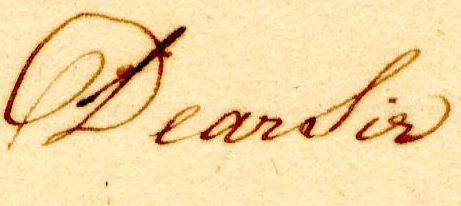Dear Sir
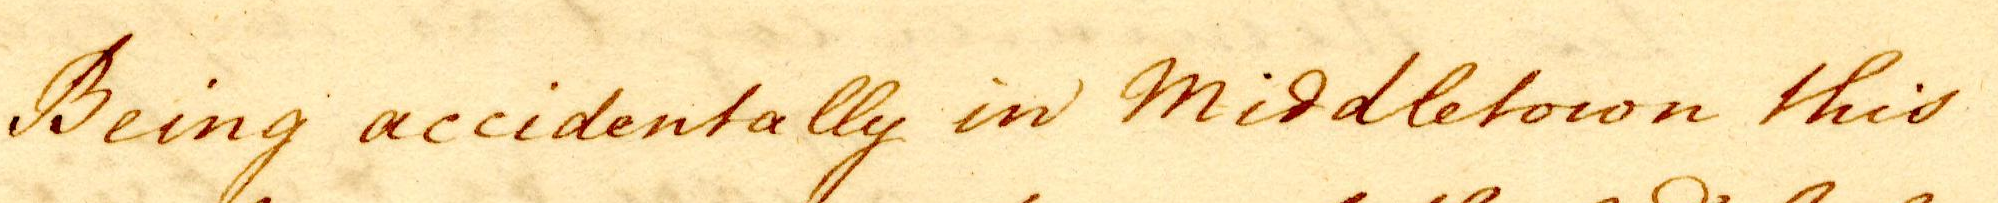Being accidentally in Middletown this
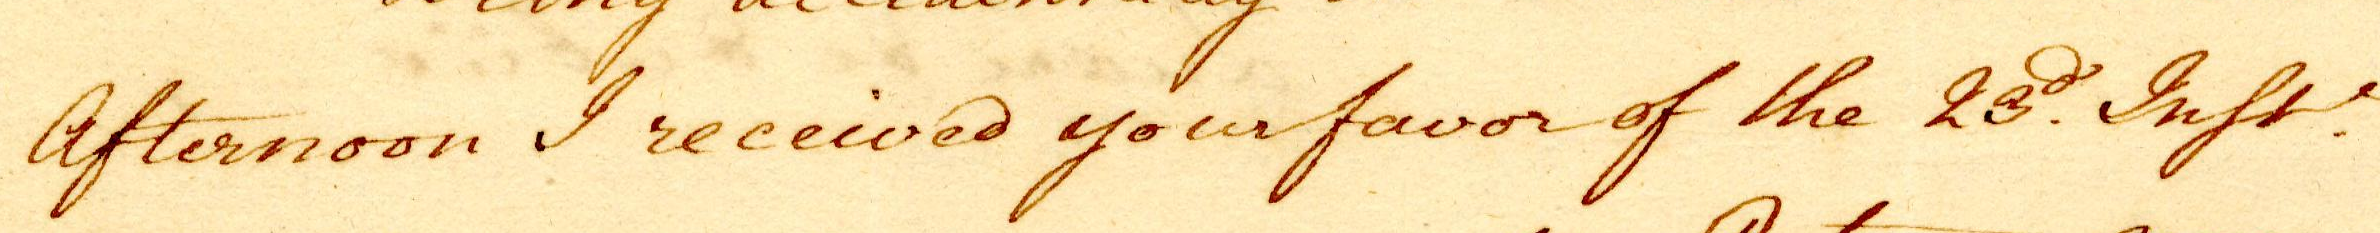Afternoon I received your favor of the 23^d. Inst.
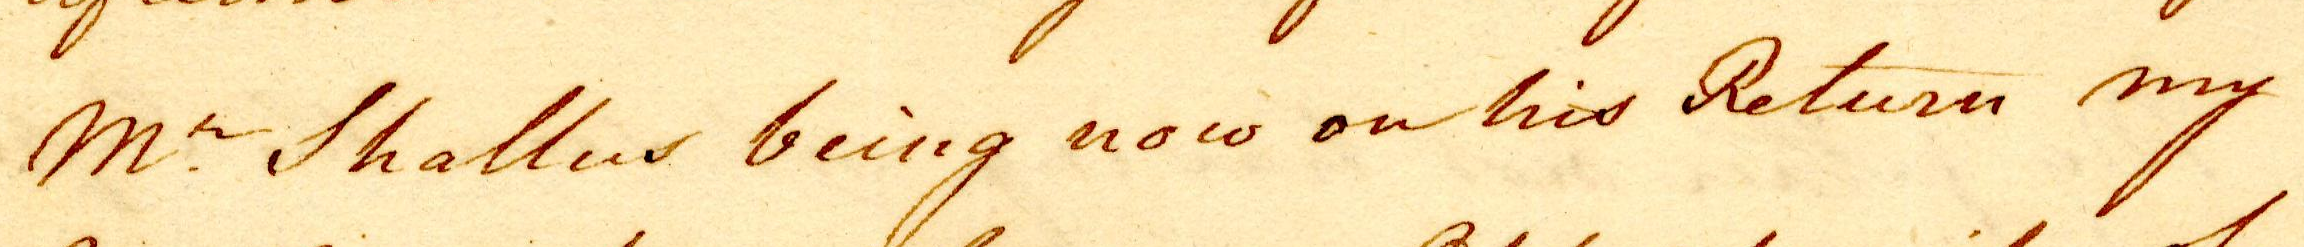M^r. Shallus being now on his Return my
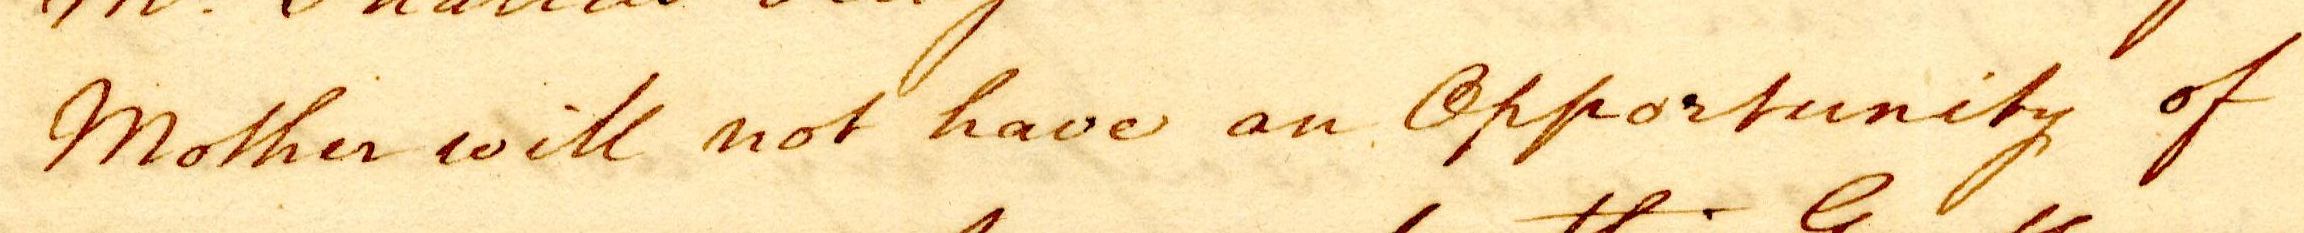Mother will not have an Opportunity of
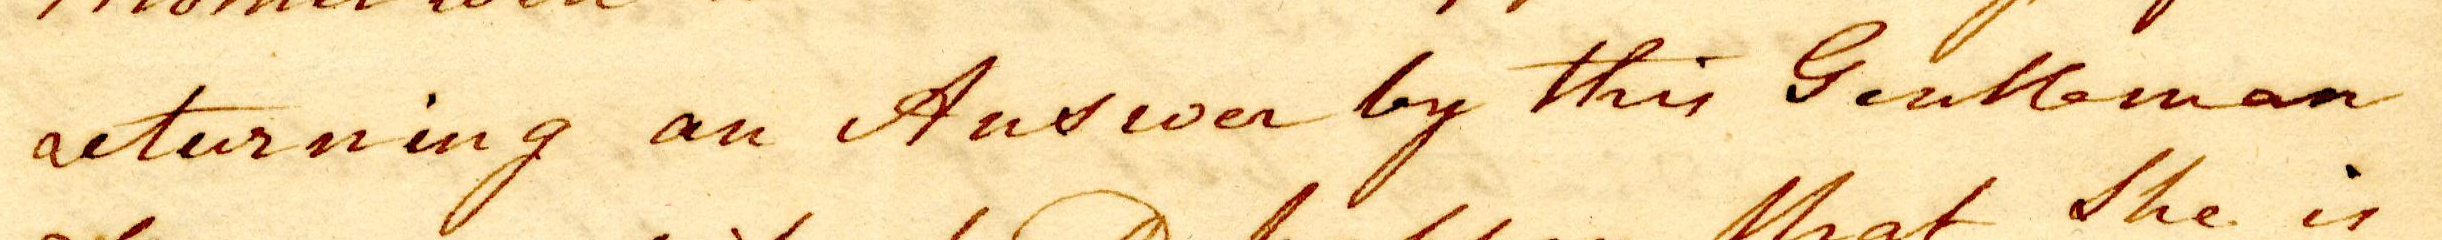returning an Answer by this Gentleman
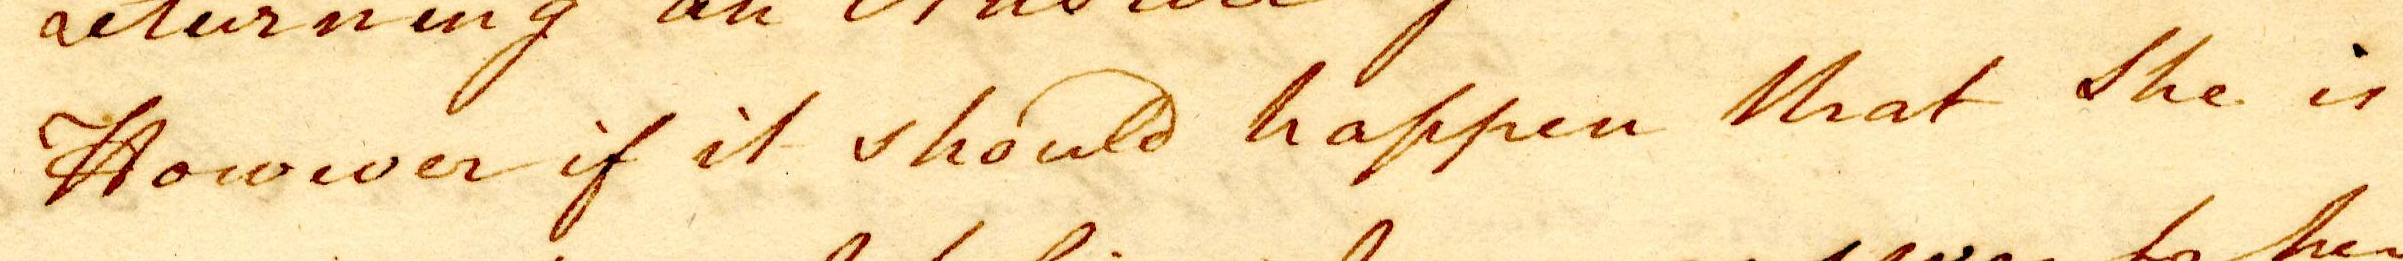However if it should happen that She is
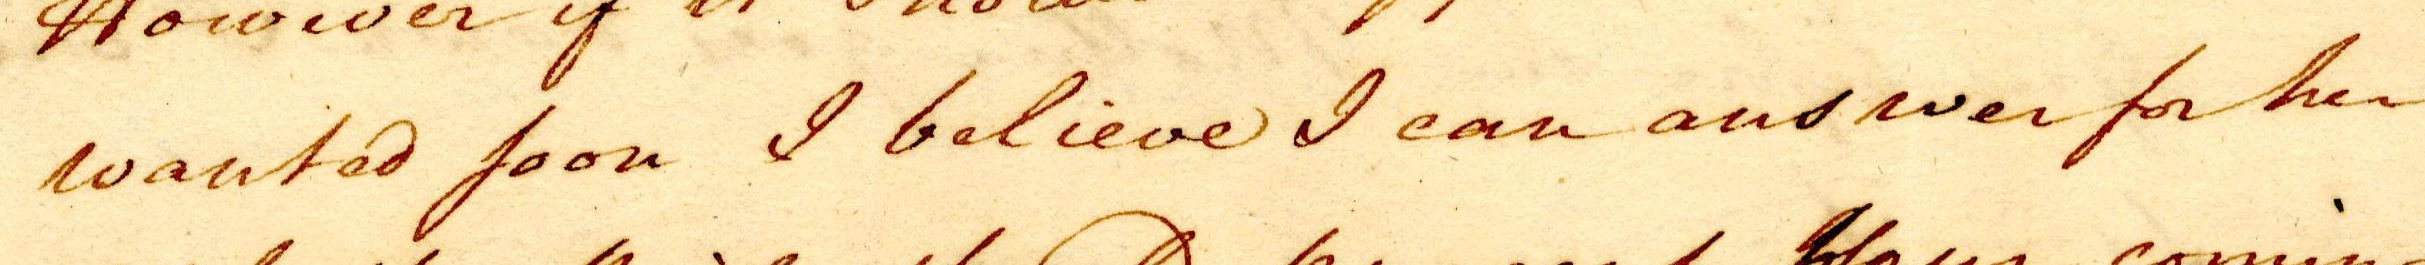wanted soon I believe I can answer for her
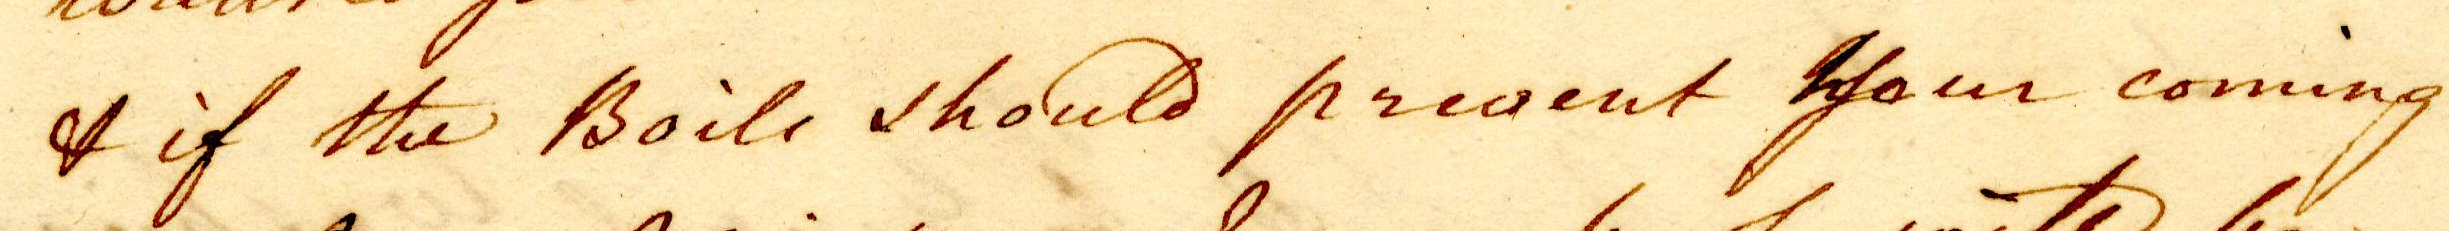& if the Boils should present Your coming
